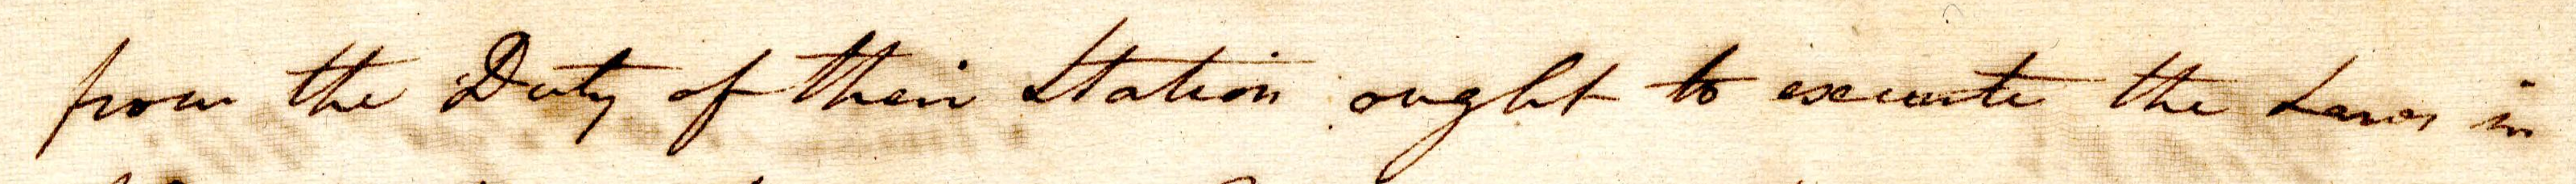from the Duty of their Station ought to execute the Laws in
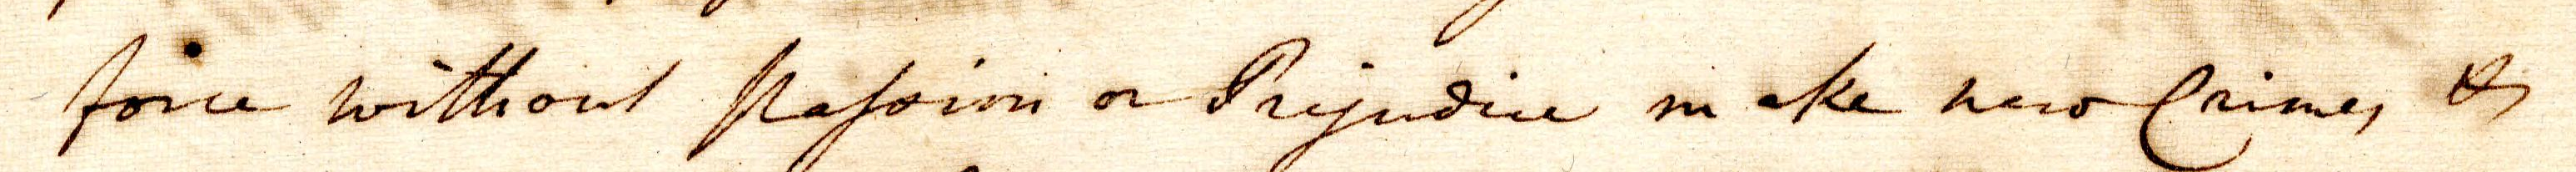force without Passion or Prejudice make new Crimes &
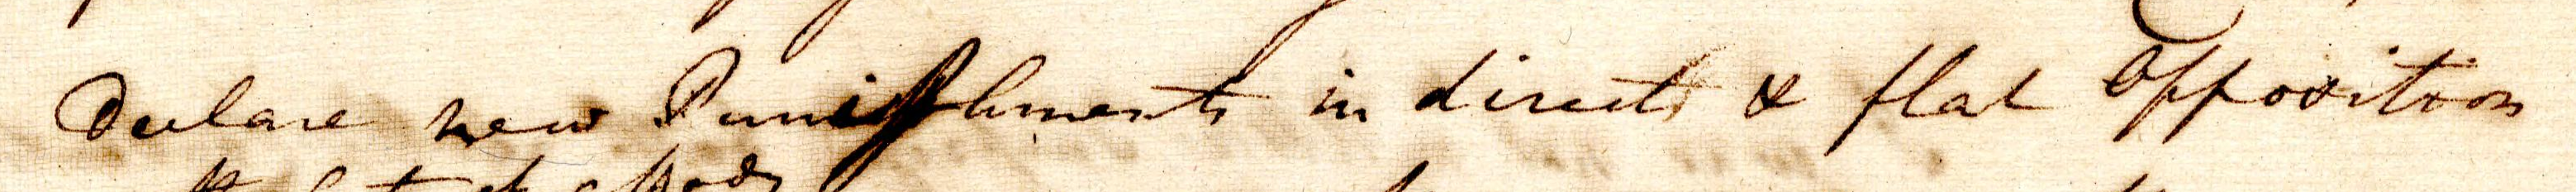declare new Punishments in direct & flat Opposition
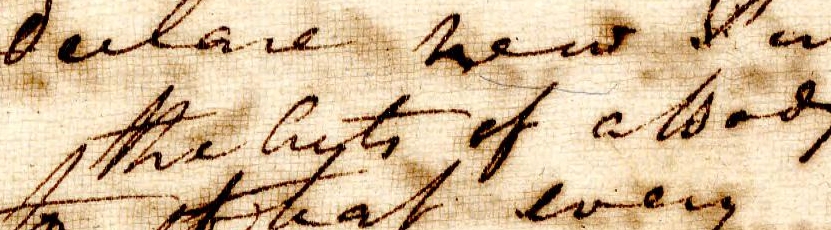the Acts of alsady
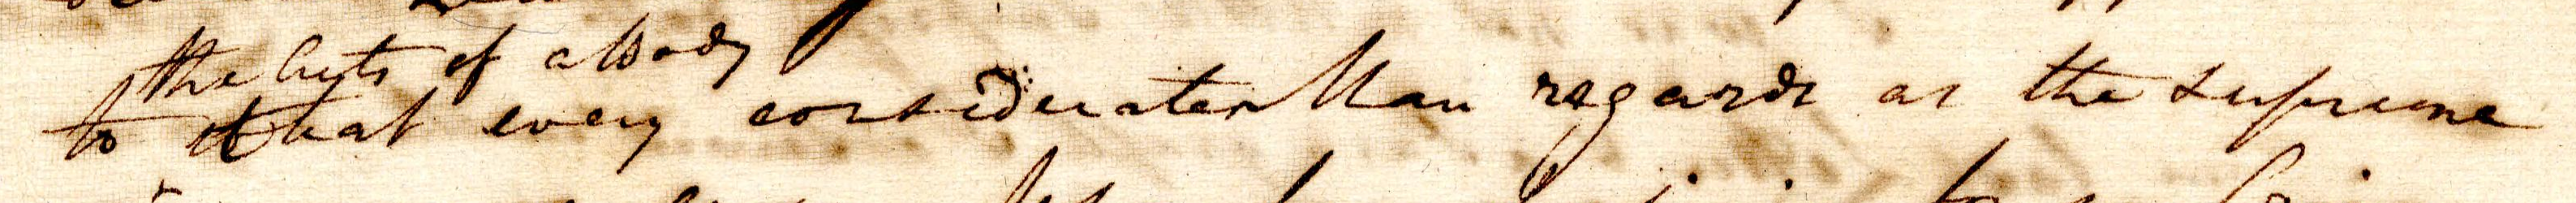to ^ that every consideration Man regards as the supreme
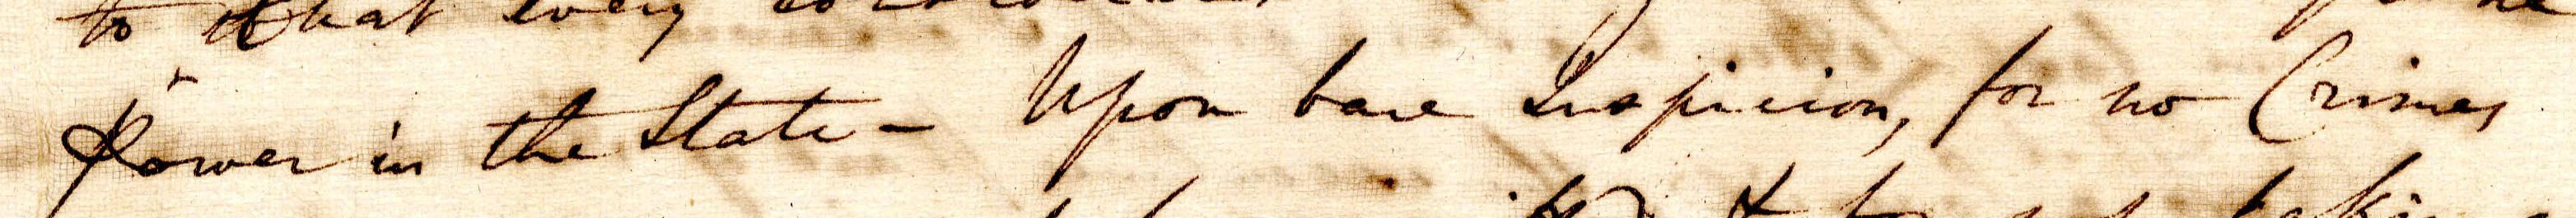Power in the State- Upon base suspicion, for no Crimes
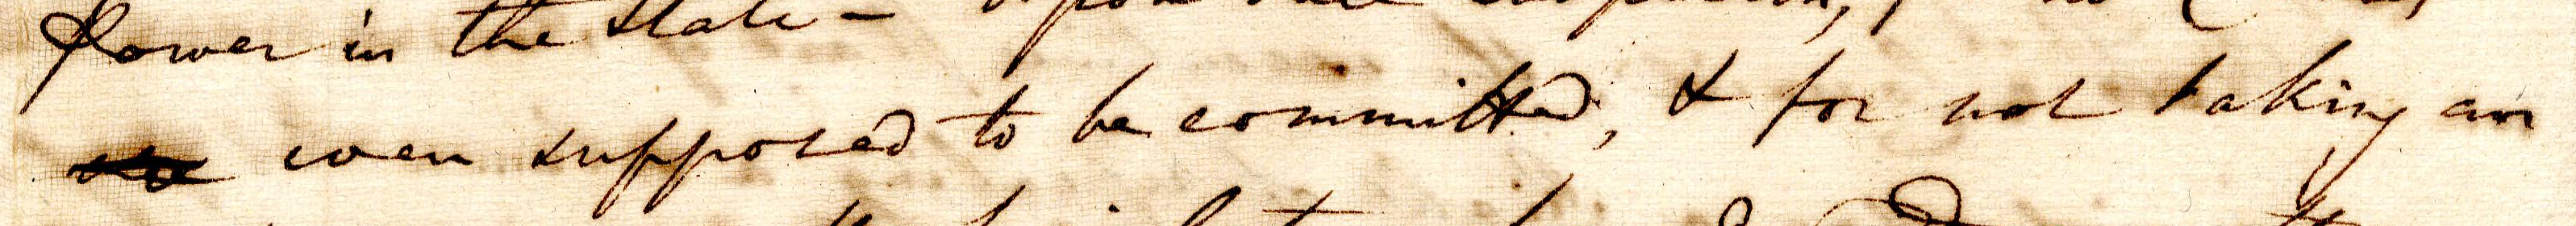[_] even supposed to be committed, & for not taking an
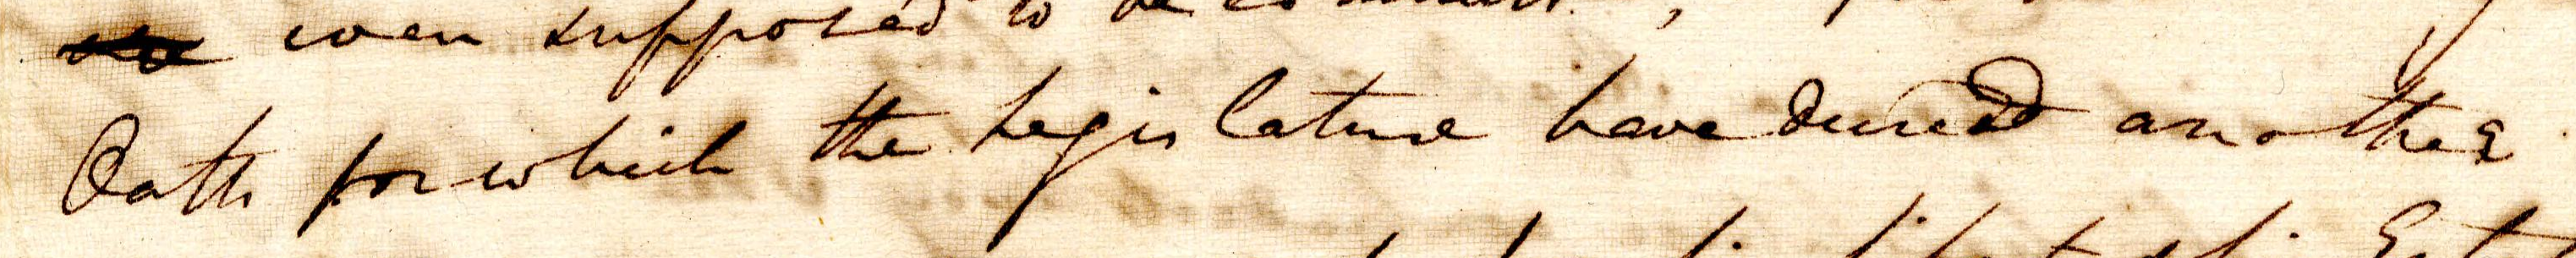Oath for which the Legislature have decreed another
